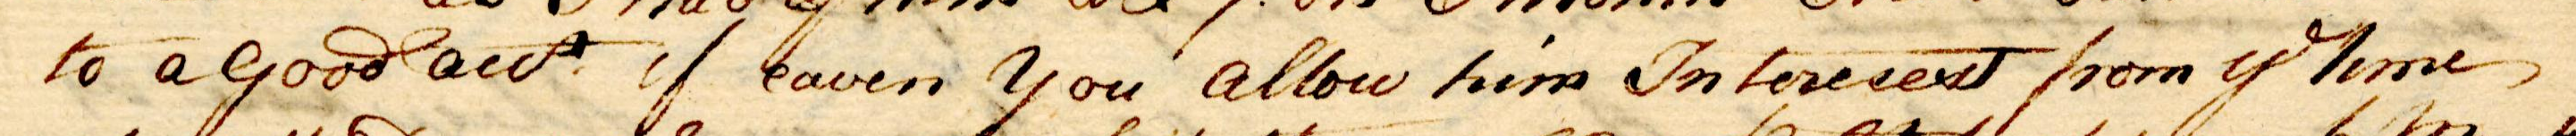to a Good acc^t. if eaven you allow him interesest from y^e Time
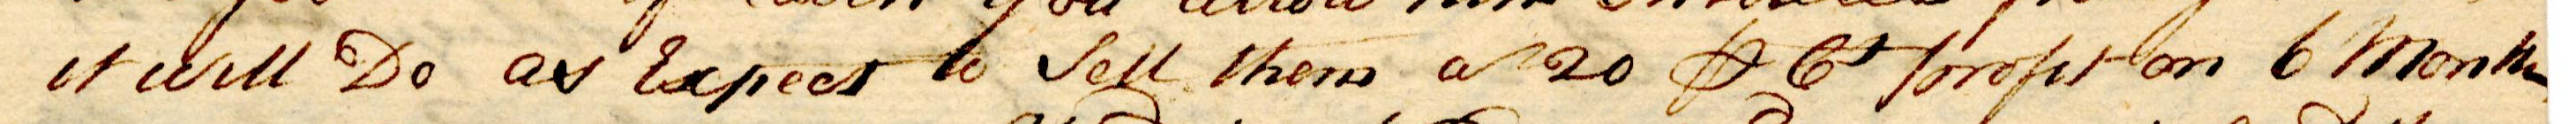it will Do as Expect to sell them @ 20 per 6^t profit on 6 month
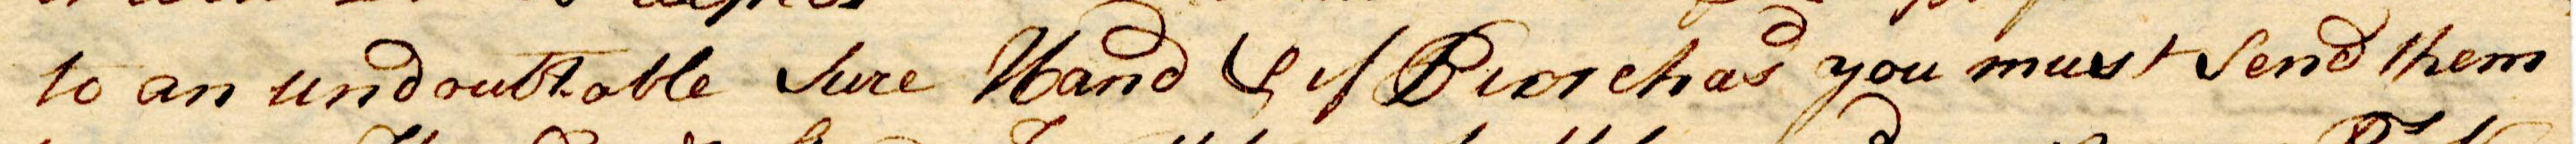to an undouttable sure Hand & if purchas you must send them
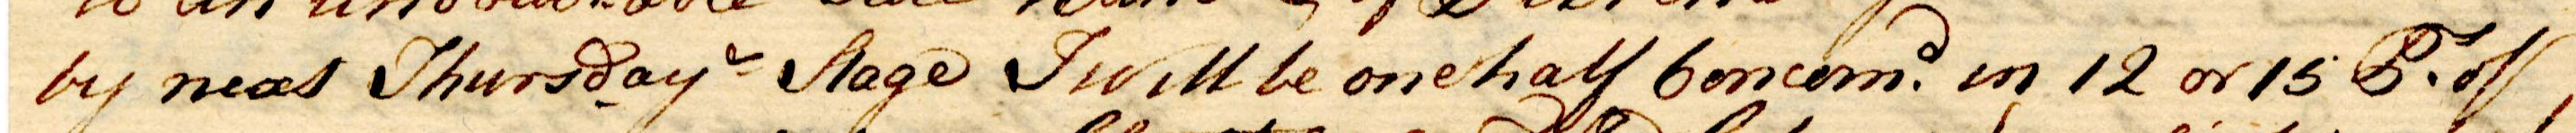by next Thursday^s Stage I will be one half Concom^d. in 12 or 15 P^s. of
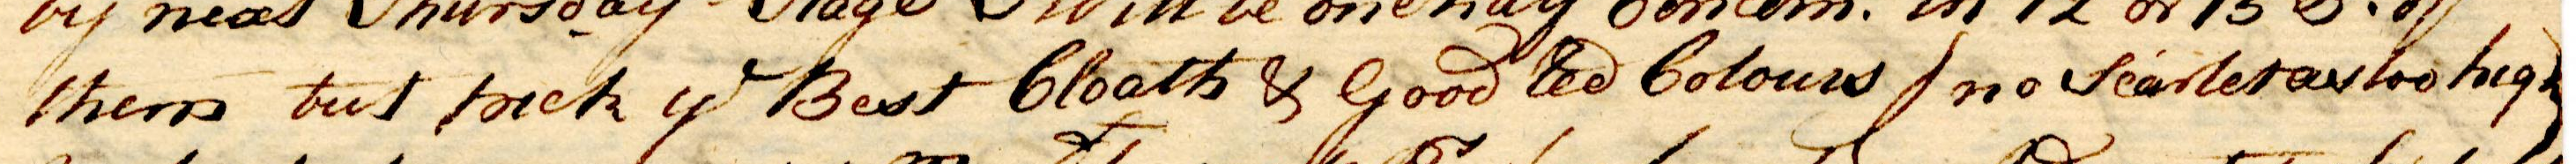them but pick y^e Best cloath & good red Colours (no scarlet as too high)
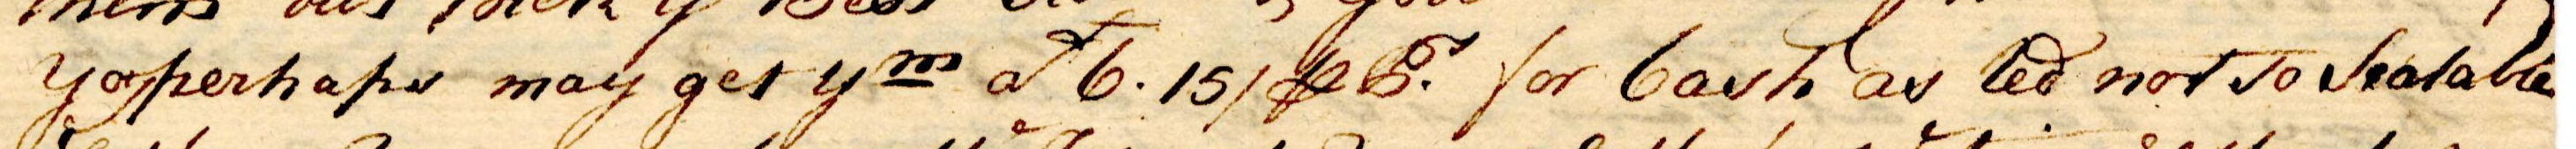you perhaps may get y^rs @ £6. 15 per P^s. for Cash as led not so Sealable
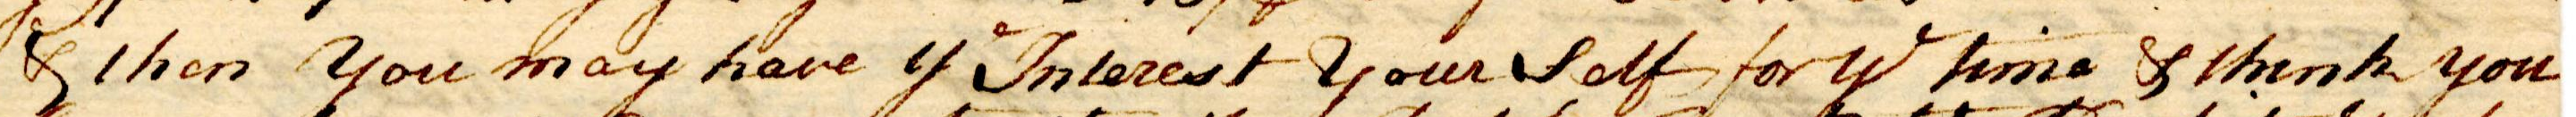& then you may have y^e Interest yourself for y^e time & think you
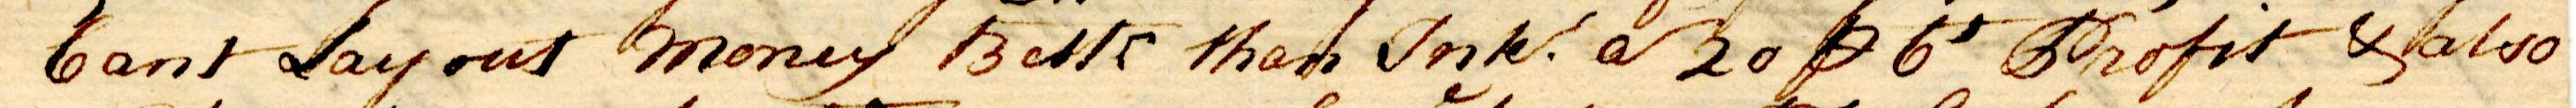Cant Lay out Money Best than Ink. @ 20 per 6^s Profit & also
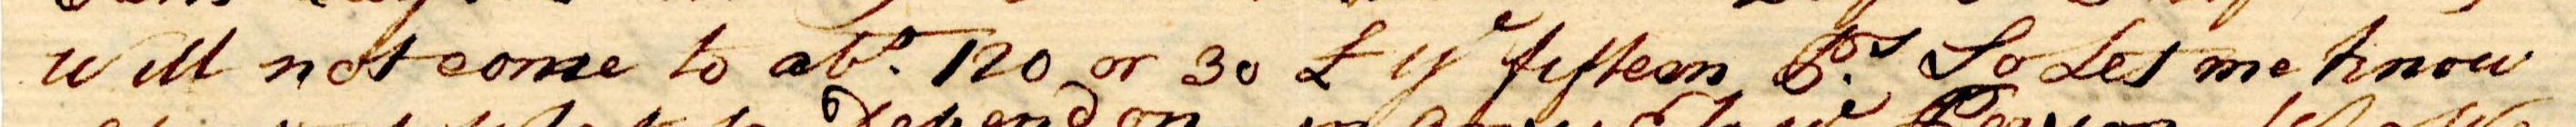will not come to ab^t. 120 or 30 £ y^e fifteen, P^s. so Let me know
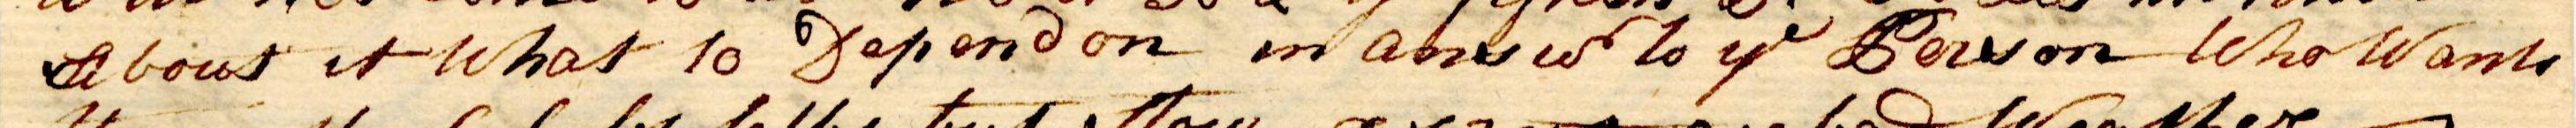about it what to Depend on in answ^r to y^e Person who wants
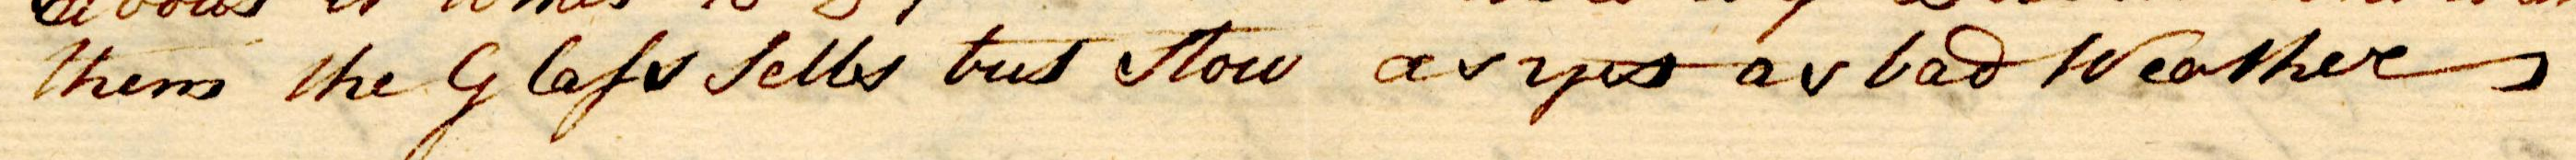them the glass sells but slow as yet as bad Weather
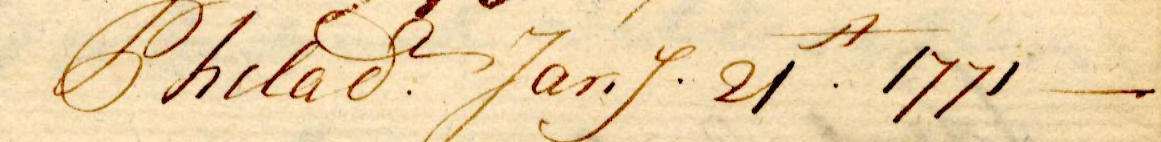Philad^a. Jan^y. 21^st. 1771-
